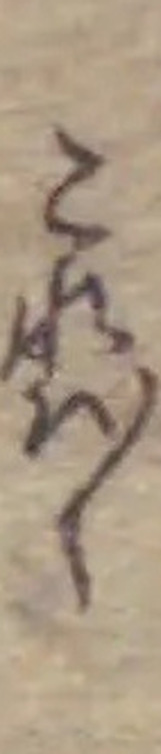これは〳〵
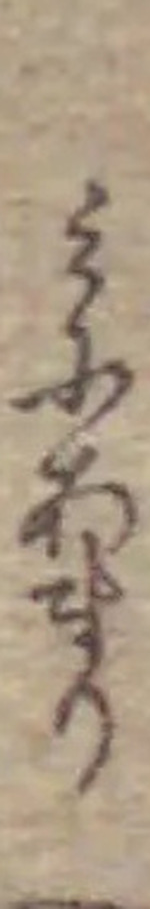みにあまり
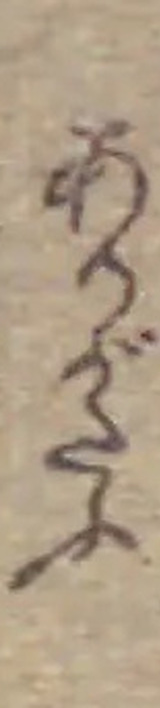ありがたふ
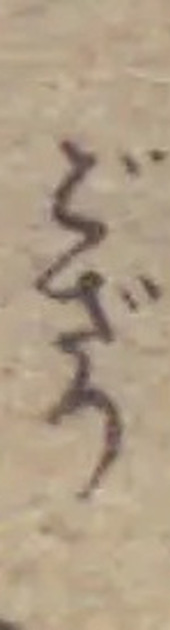ござり
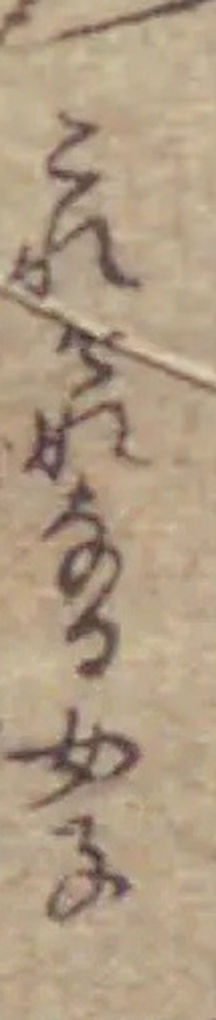これそれなる女子
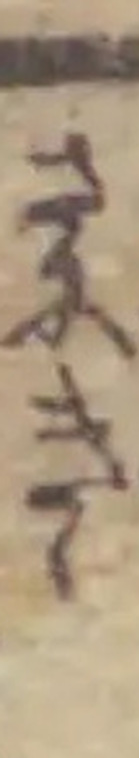さにきゝ
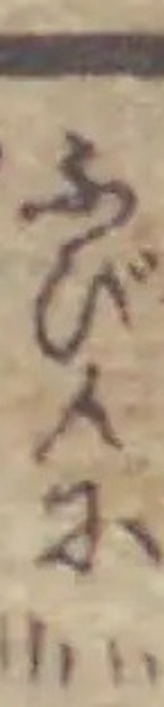ふびんに
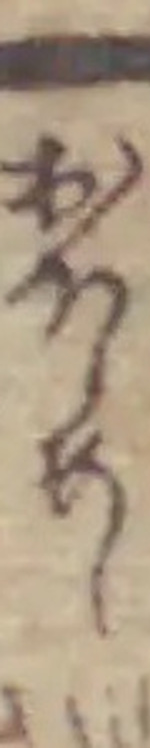おほしめし
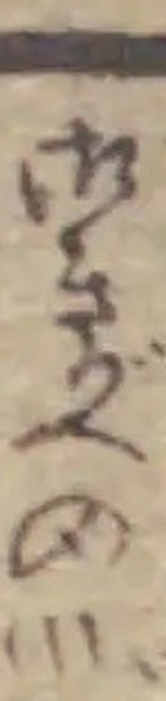御きがへの
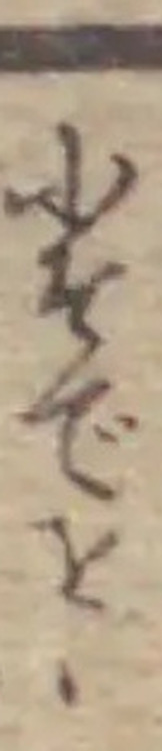小そでを
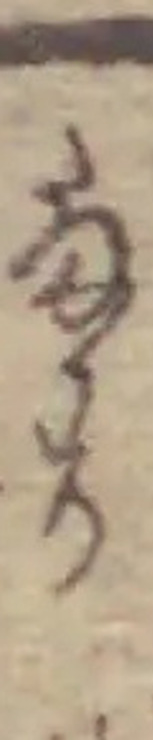たまわり

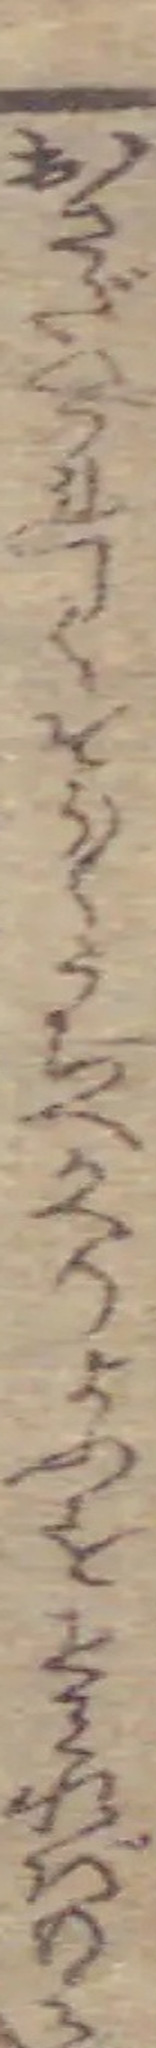おさだはうれしくそう〳〵うちへかへりよふすをみればもはや
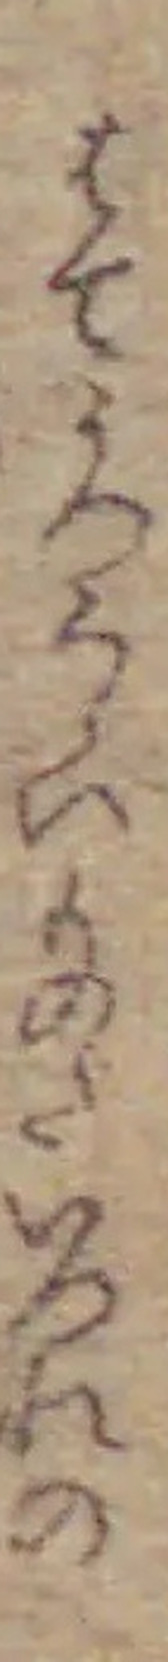はてうつくしいものたいつれの
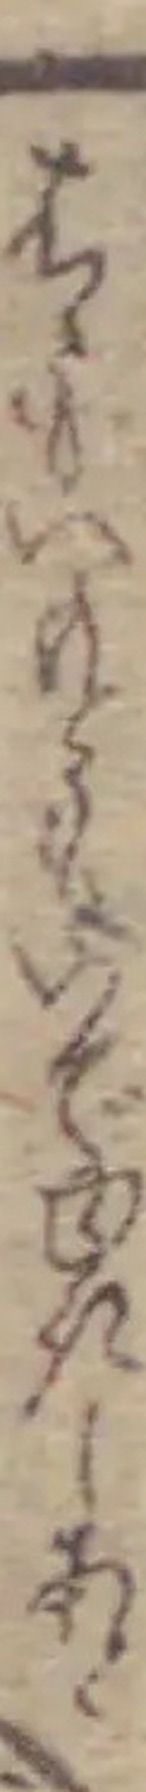はゝもいもともいでゆきしあと
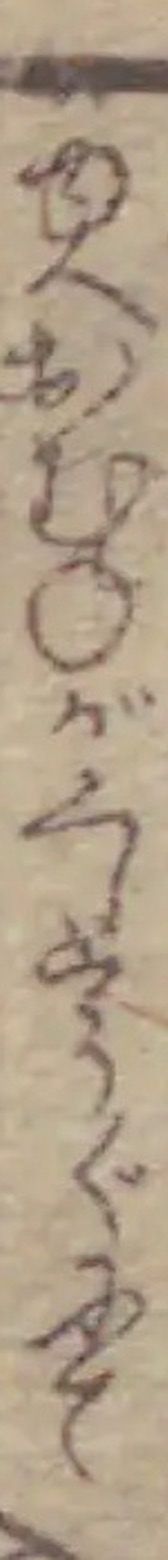ゆへおむねがくしとうぐにて
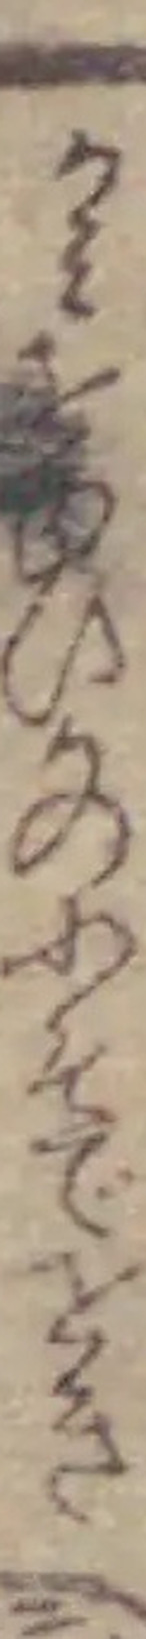かみをゆひかの小そでをき
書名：奥州咄 3巻
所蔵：国立国会図書館 National Diet Library, JAPAN
